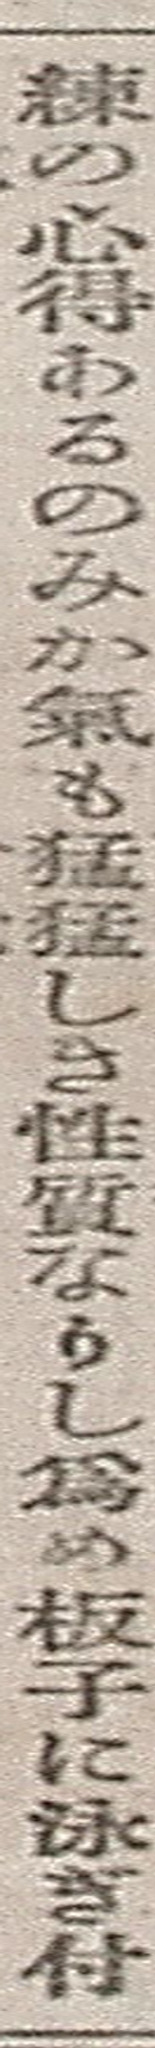練の心得あるのみか気も猛猛しき性質なりし為め板子に泳ぎ付
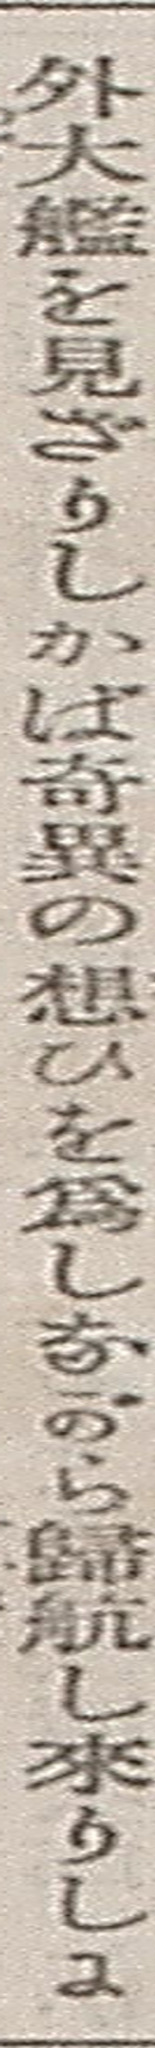外大艦を見ざりしかば奇異の思ひを為しながら帰航し来りしに
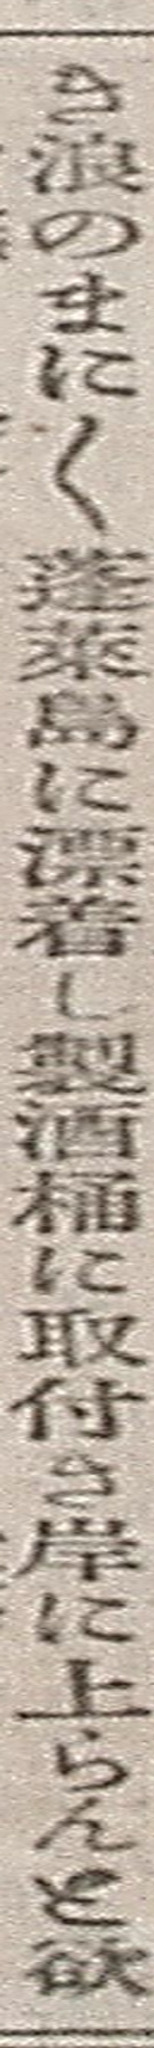き波のまに〳〵蓬莱島に漂着し製酒桶に取付き岸に上らんと欲
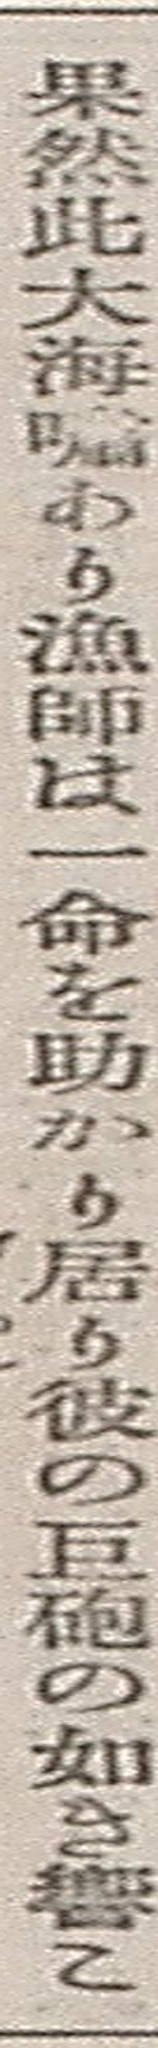果然此大海嘯あり漁師は一命を助かり居り彼の巨砲の如き響こ
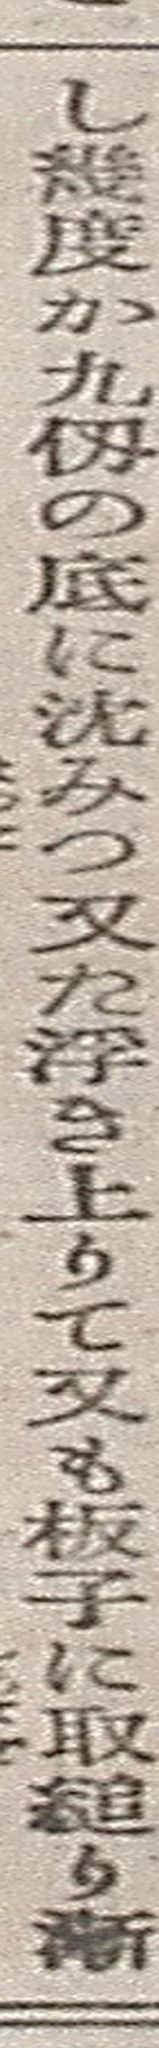し幾度か九仭の底に沈みつ又た浮き上りて又も板子に取縋り漸
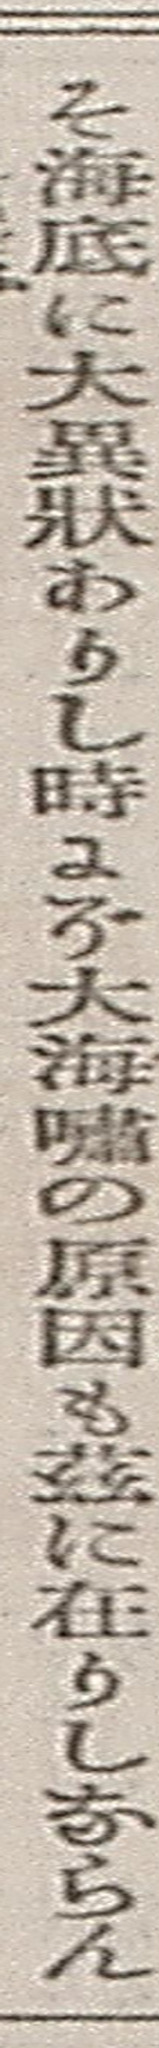そ海底に大異状ありし時にぞ大海嘯の原因も茲に在りしならん
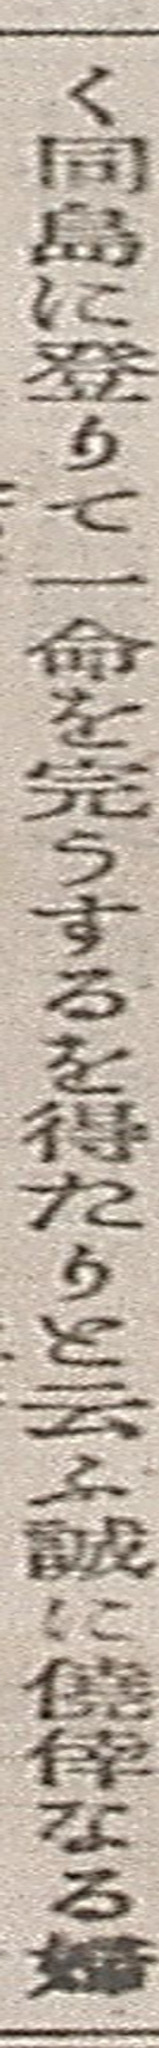く同島に登りて一命を完うするを得たりと云ふ誠に僥倖なる婦
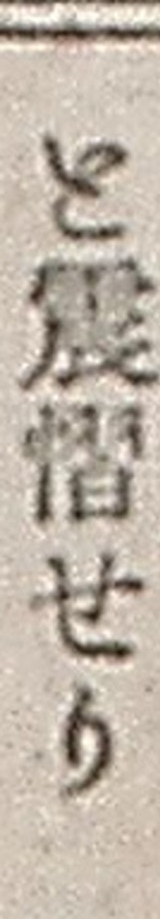と震摺せり
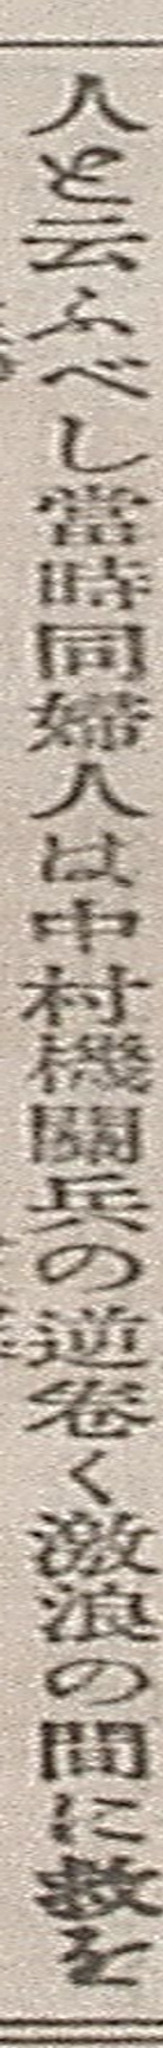人と云ふべし当時同婦人は中村機関兵の逆巻く激浪の間に救を
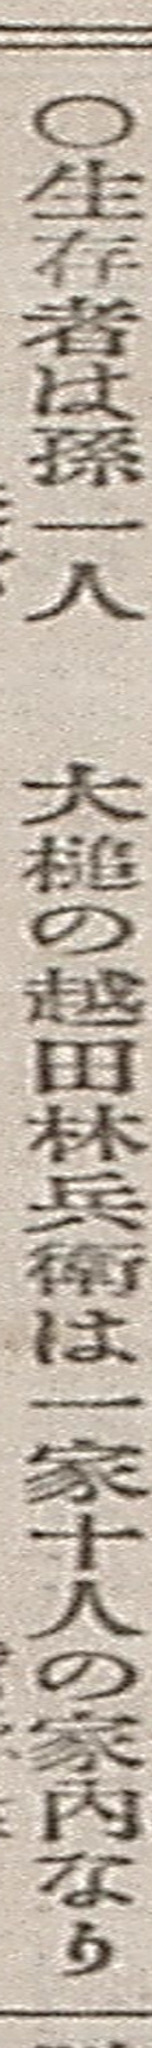○生存者は孫一人大槌の越田林兵衛は一家十人の家内なり
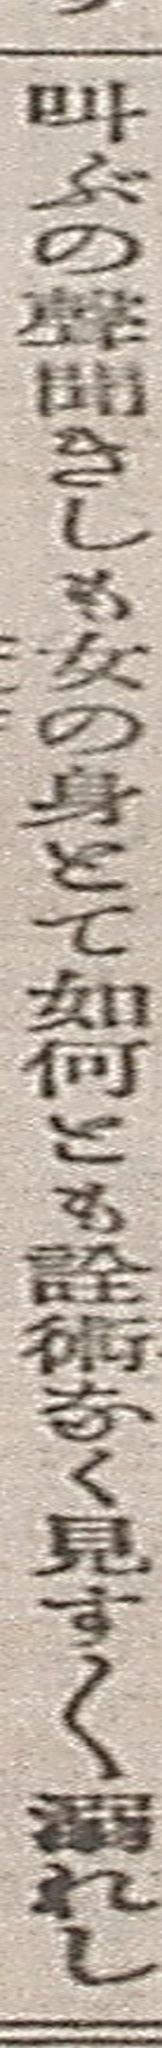叫ぶの声聞きしも女の身とて如何とも詮術なく見す〳〵溺れし
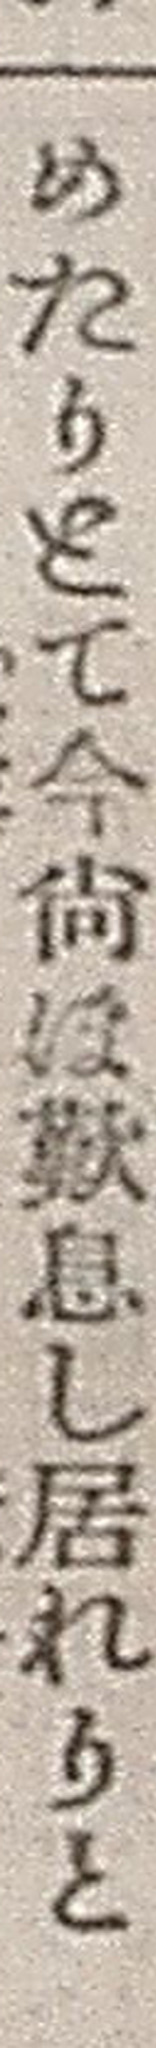めたりとて今尚ほ歎息し居れりと
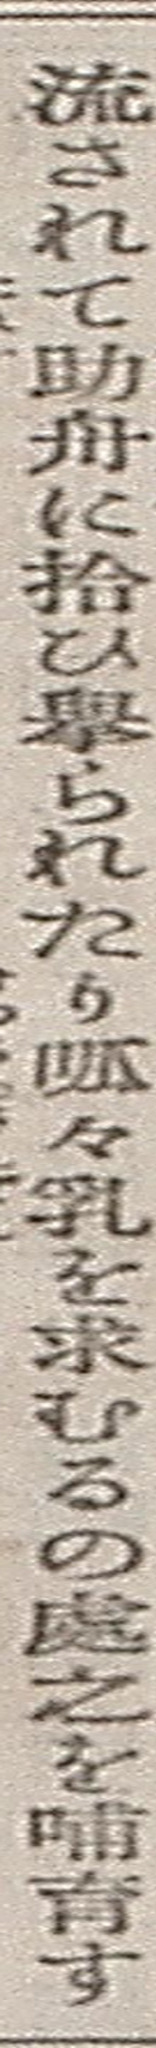流されて助舟に拾ひ挙られたり呱々乳を求むるの処之を哺育す
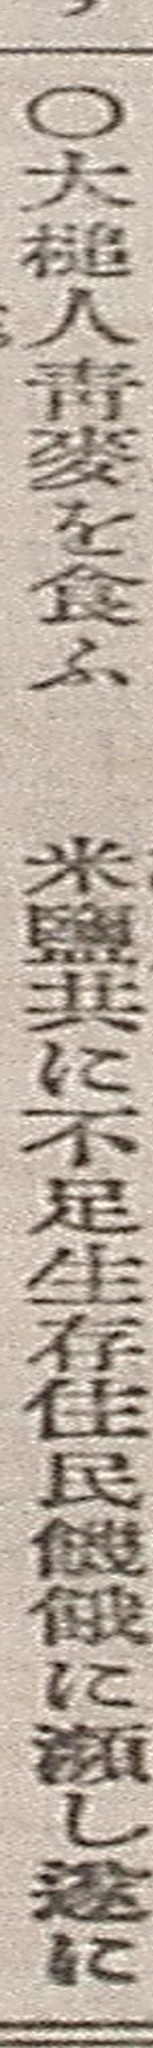○大槌人青麦を食ふ米塩共に不足生存住民饑餓に瀕し遂に
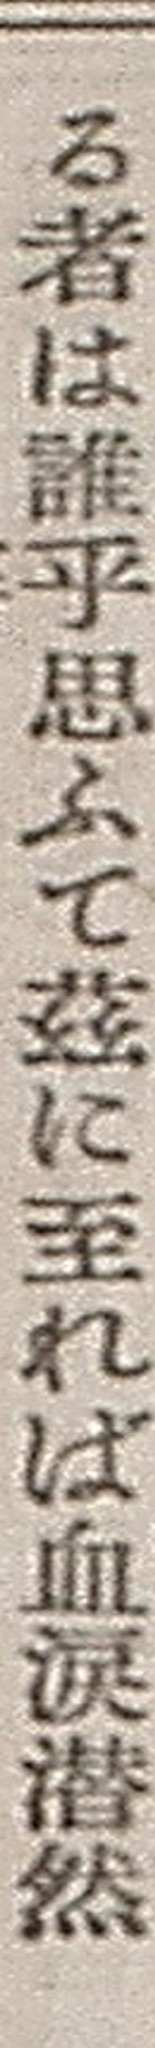る者は誰乎思ふて茲に至れば血涙潜然
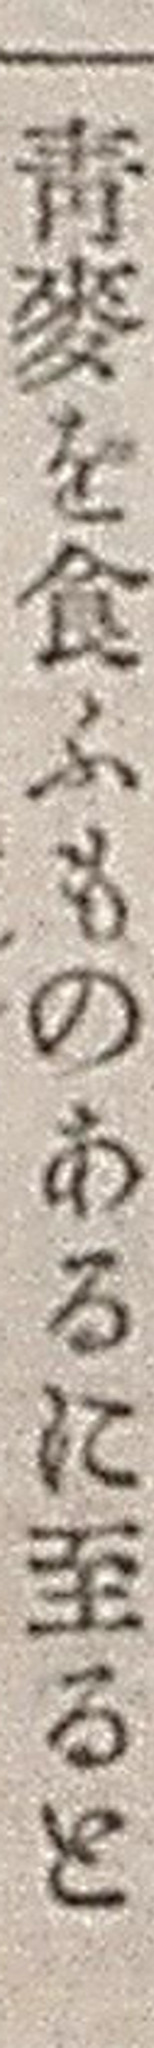青麦を食ふものあるに至ると
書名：風俗畫報臨時増刊第百十九號　大海嘯被害録（中）
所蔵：東京大学地震研究所図書室 Earthquake Research Institute Library, The University of Tokyo, JAPAN
